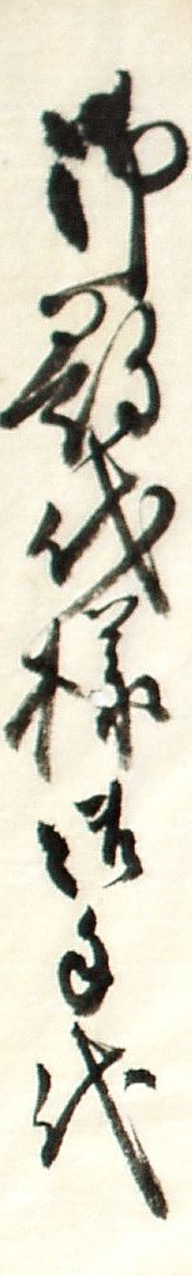御郡代様御手代
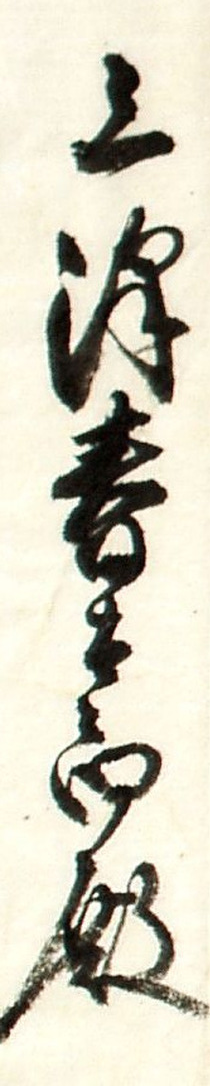三澤春太郎殿
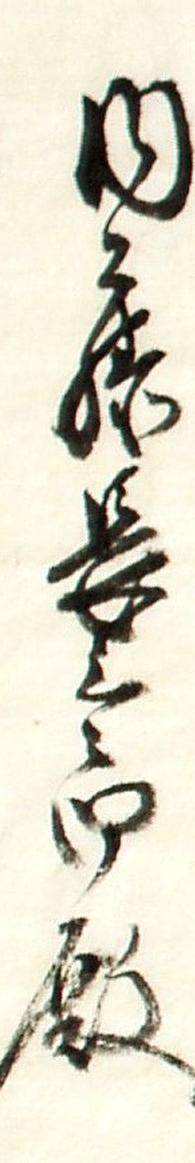内藤長三郎殿
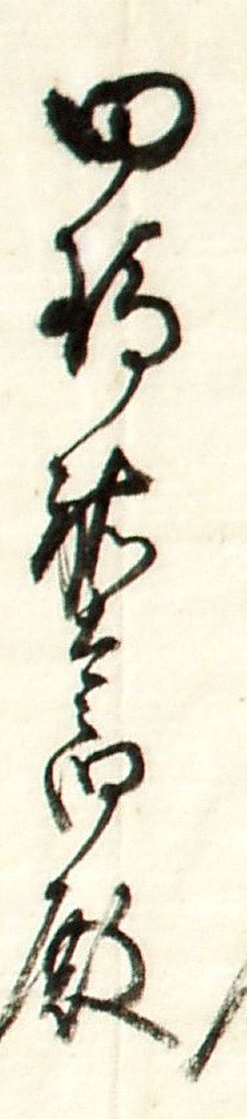田野祐太郎殿
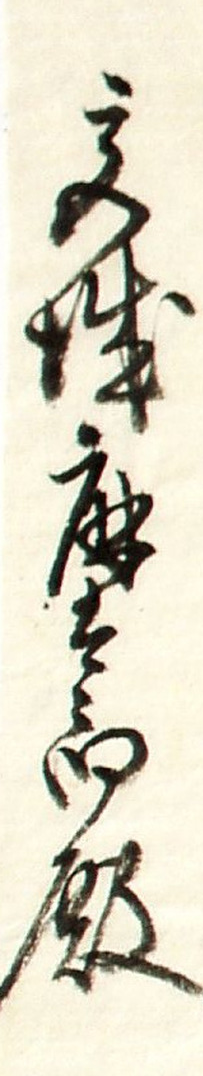宮城麻太郎殿

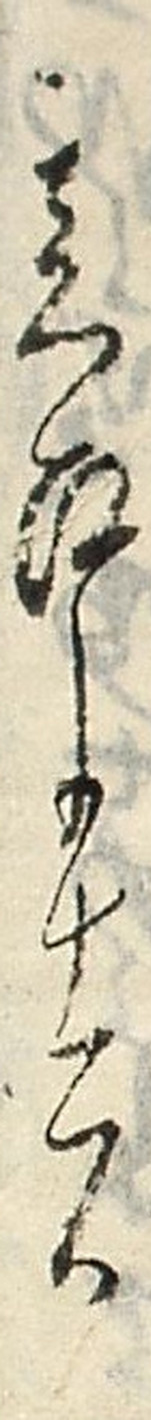亥四月十二日

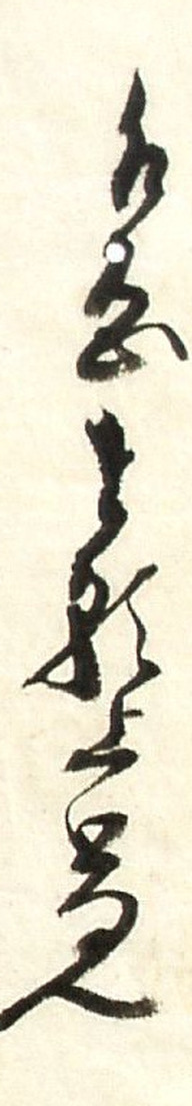乍恐奉願上覚
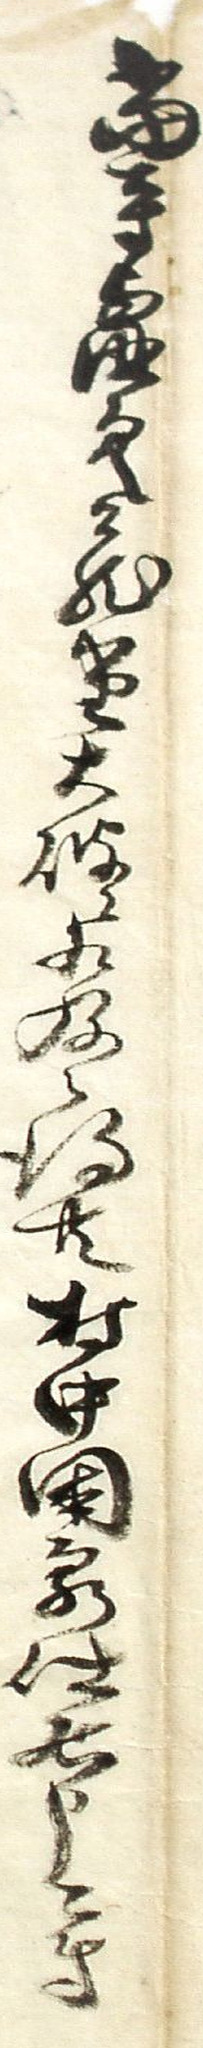當寺虚空蔵堂大破ニ相及候得共村中困窮仕居申ニ付
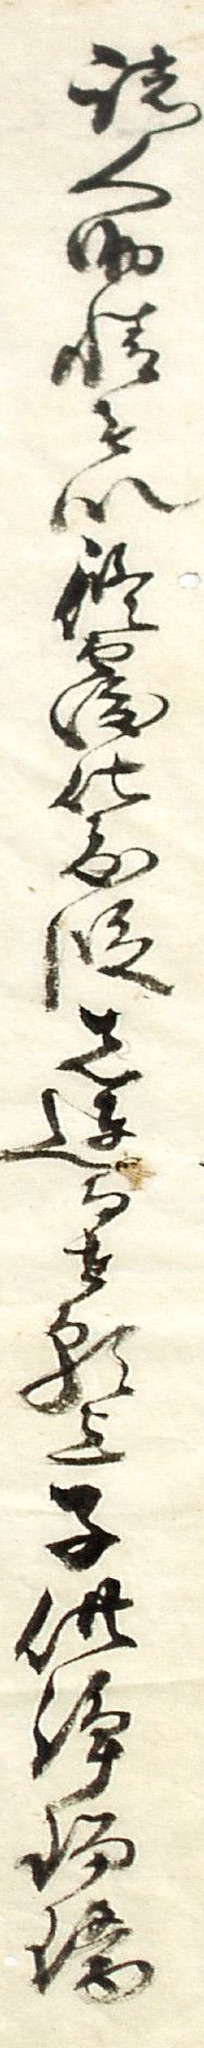諸人助情を以修覆仕度段先達而奉願上子供浄瑠璃
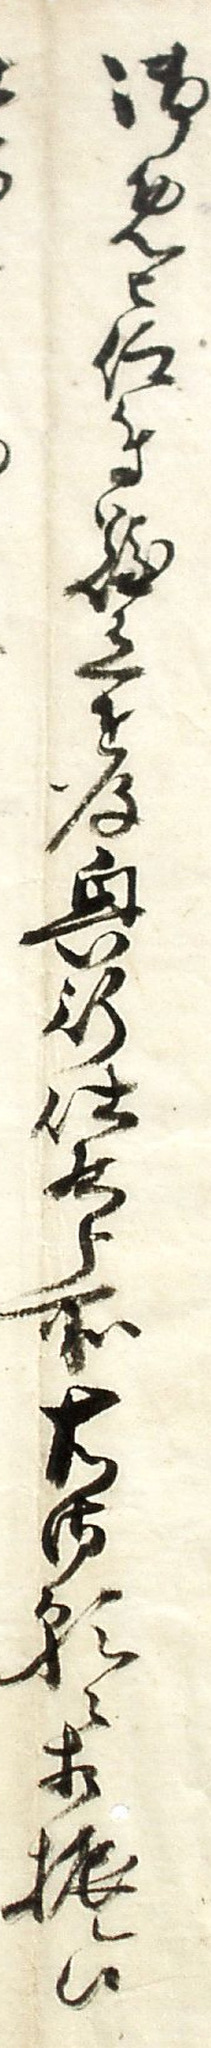御免被仰付難有奉存興行仕居申所右御願ニ相振レ候
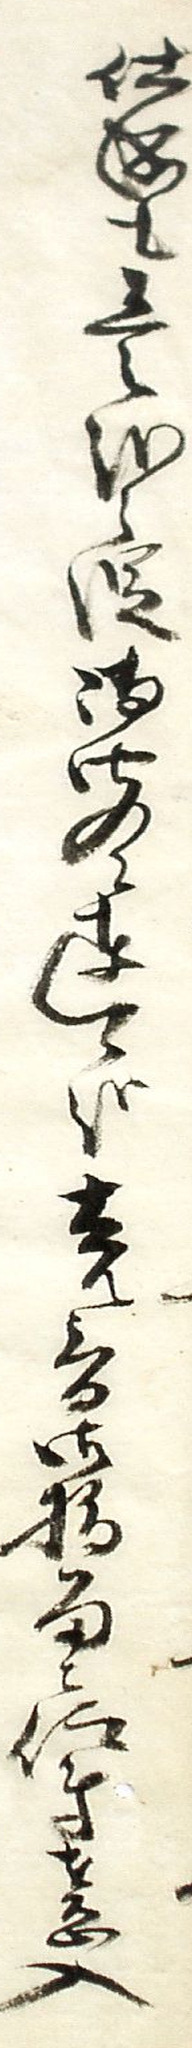仕成も有之哉之段御聞ニ達候哉去ル三日御指留被仰付奉恐入
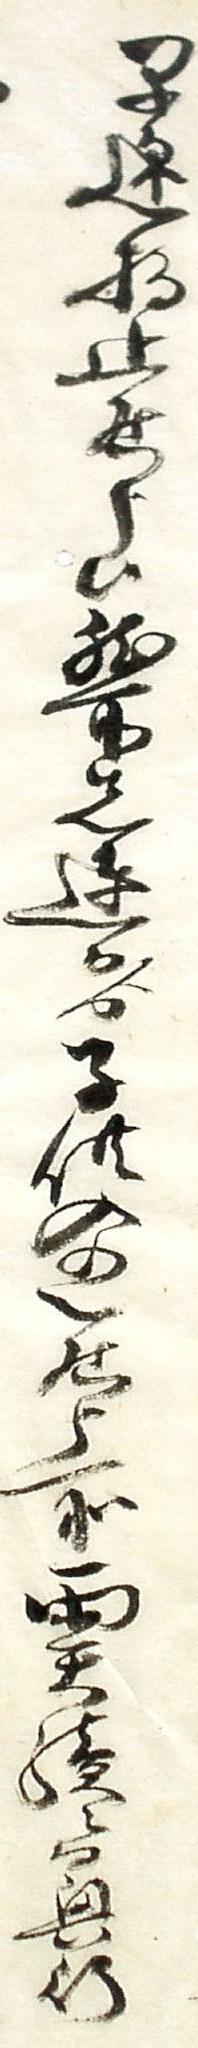早速指止居申候然所先達而ゟ子供入込居申所雨天續ニ而興行
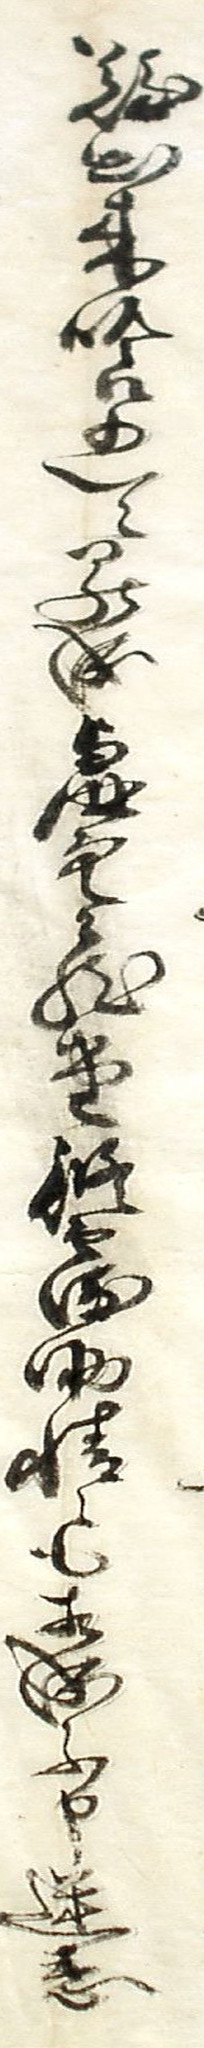難出来喰込ニ罷成虚空蔵堂修覆助情ニも相成不申迷惑
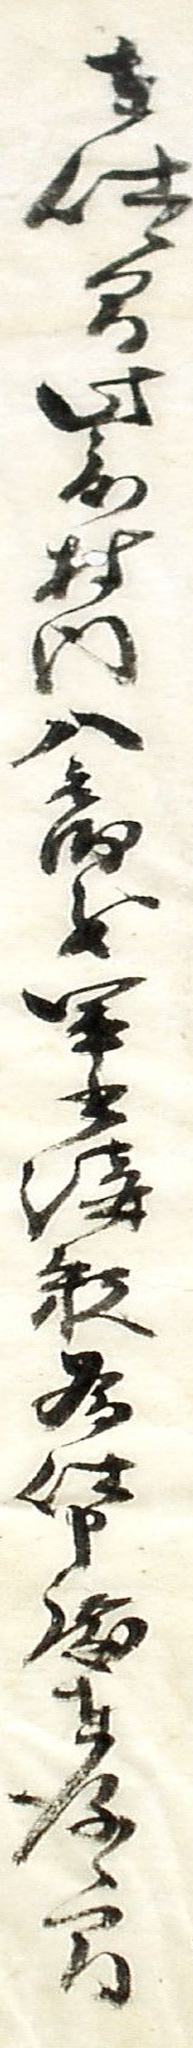奉仕候間此度村内八兵衛義軍書講釈為仕申度奉存候間
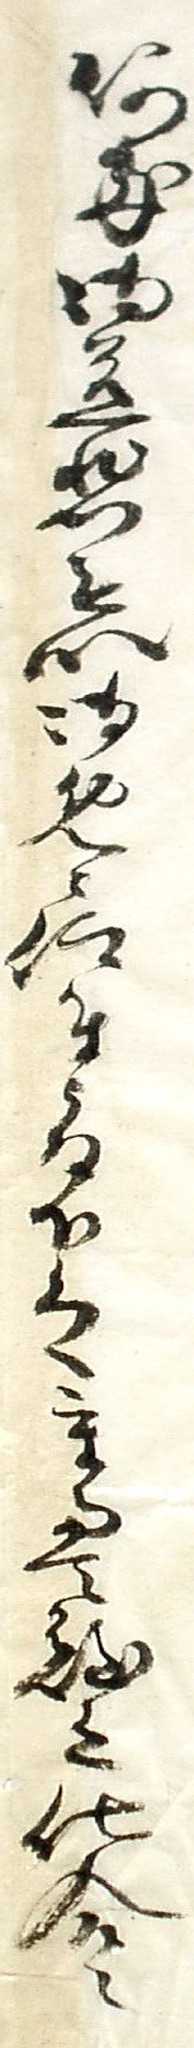何卒御慈悲を以御免被仰付被為下候ハヽ重畳難有仕合ニ
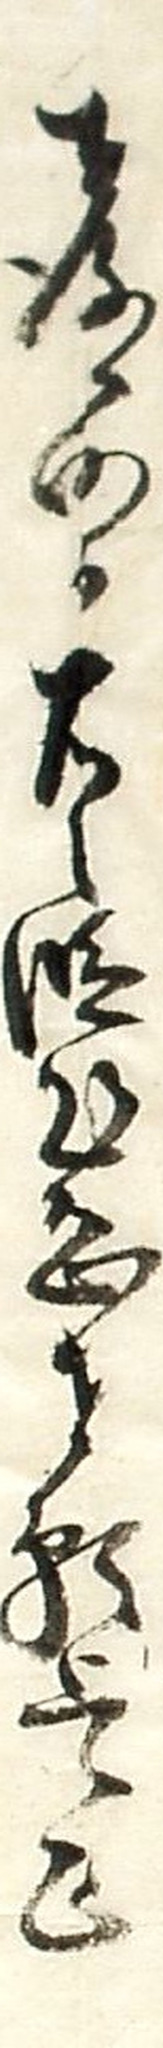奉存候仍而右之段乍恐奉願上候以上
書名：(早渕村福満寺子供浄瑠璃願書）他
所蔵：鳴門教育大学 Naruto University of Education
